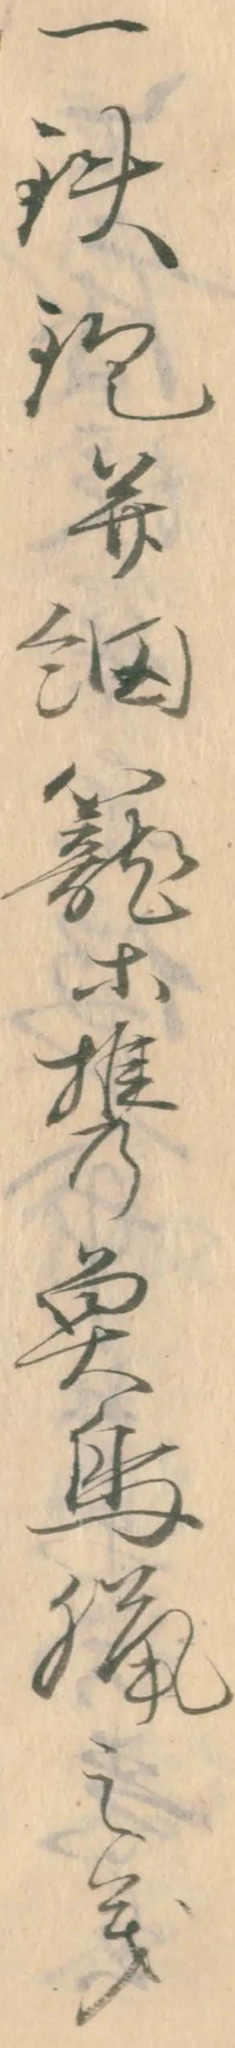一鉄砲并網籠等携魚鳥猟之義
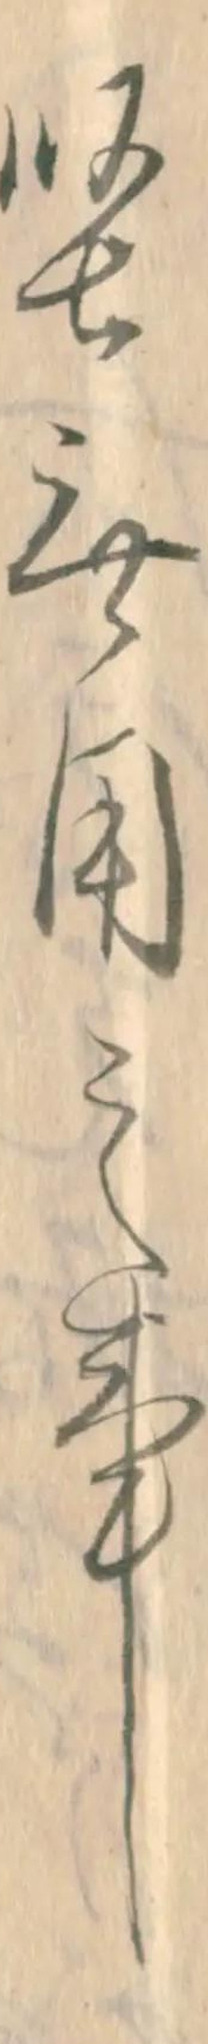堅無用之事
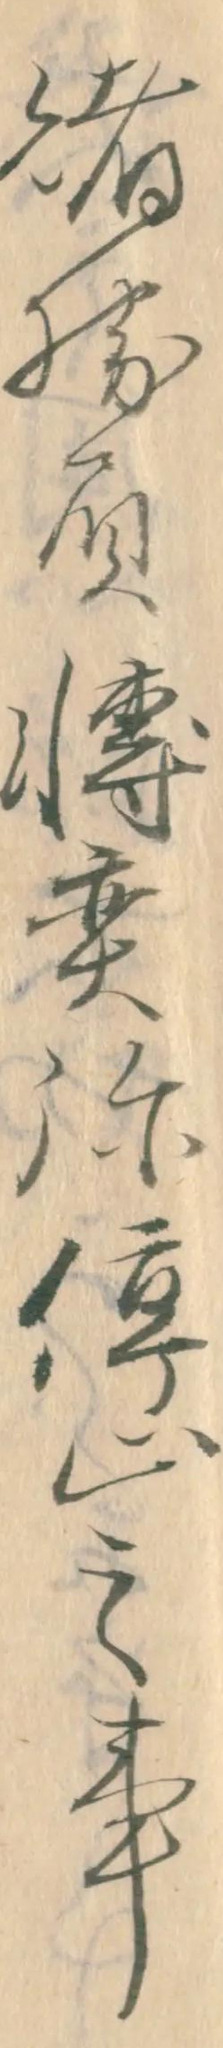一賭勝負博奕弥停止之事
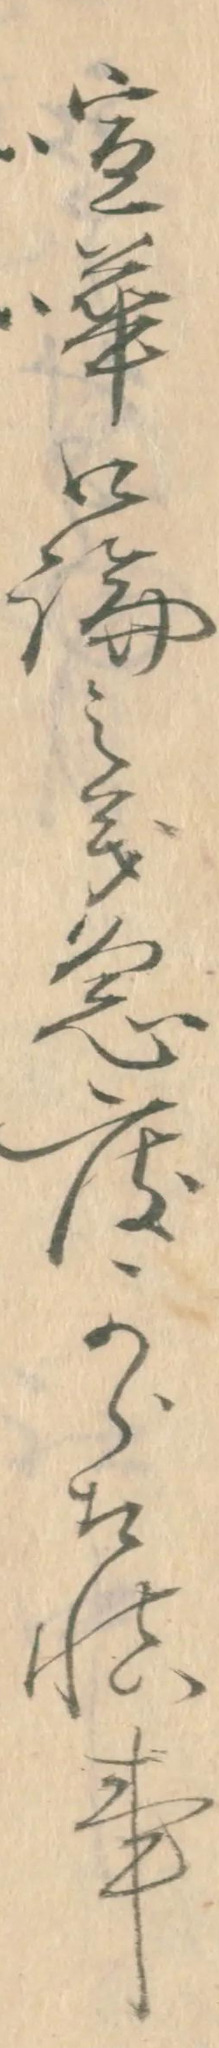一喧嘩口論之義急度可被相慎事
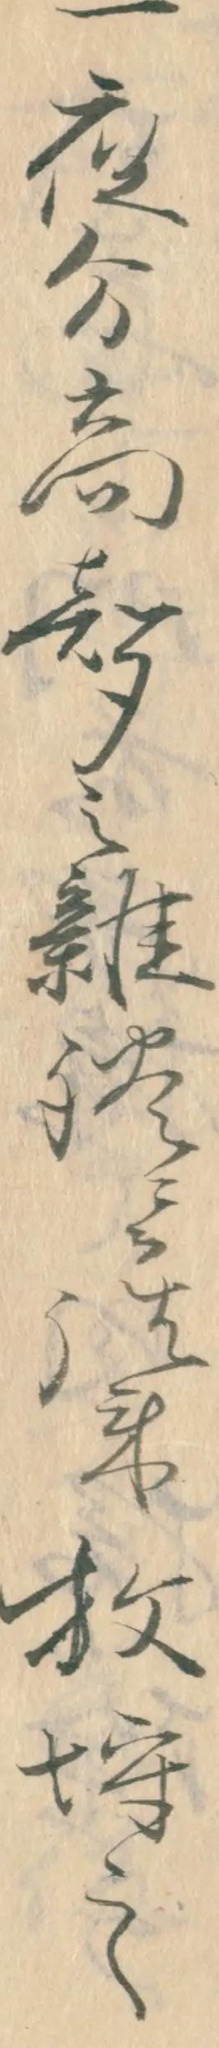一夜分高声之雑談に而往来放埒之
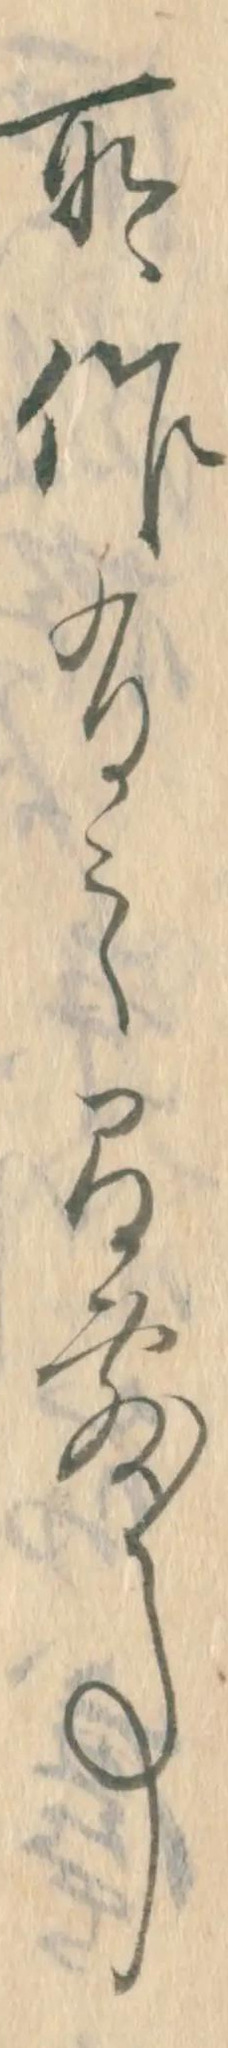所作有之間敷事
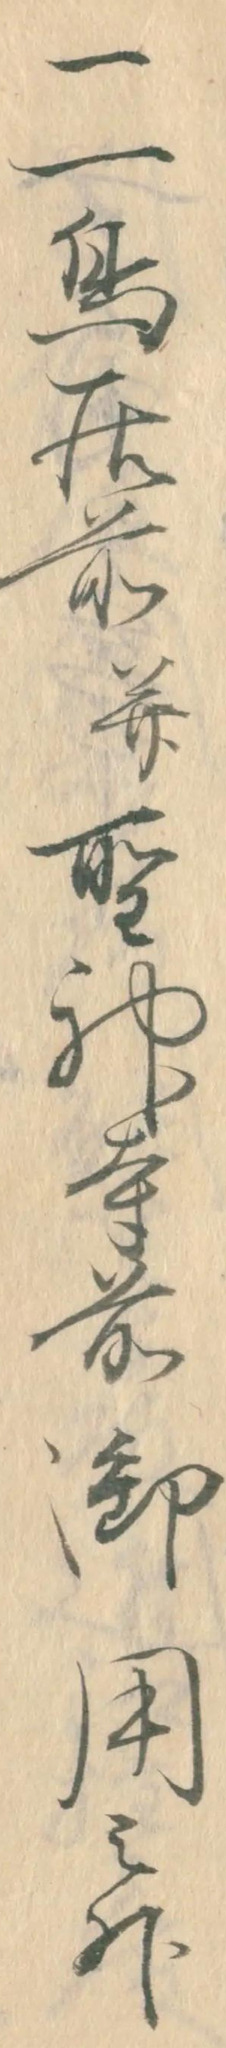一一鳥居前并聖神寺前御用之外
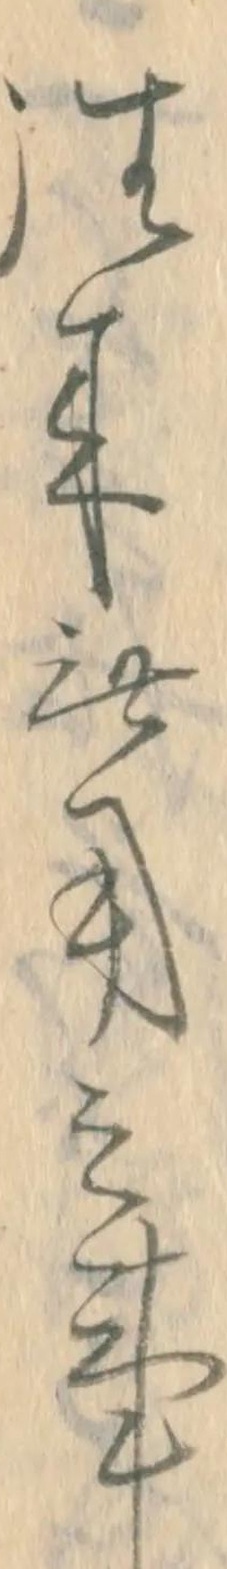往来無用之事

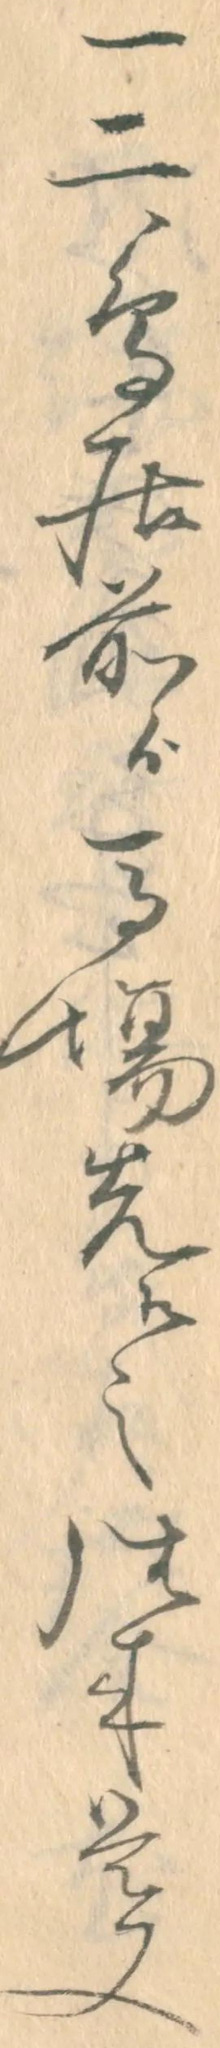一二ノ鳥居前ゟ馬場先江之往来是又
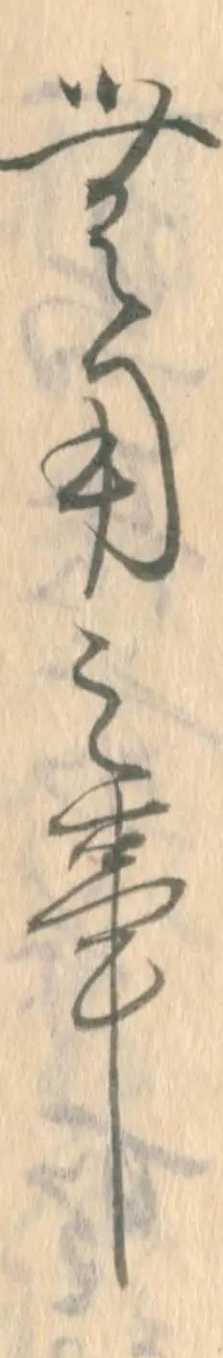無用之事
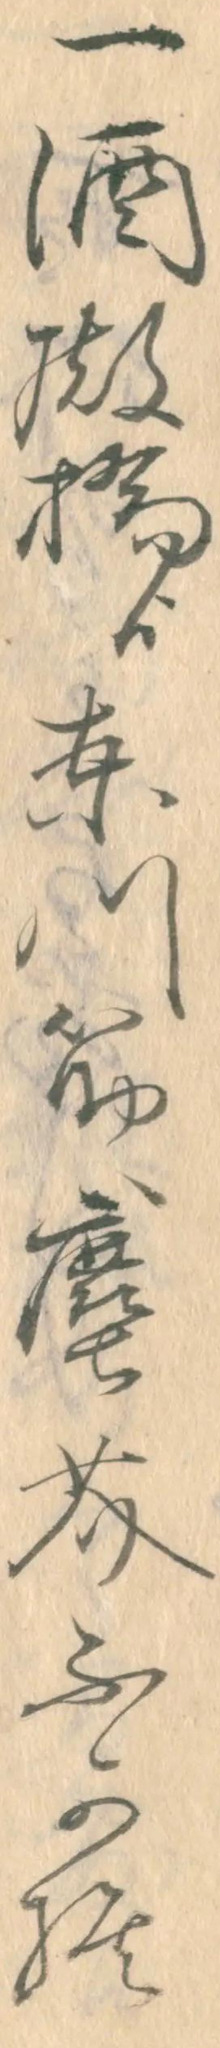一酒殿橋ゟ東門筋へ塵芥不可捨
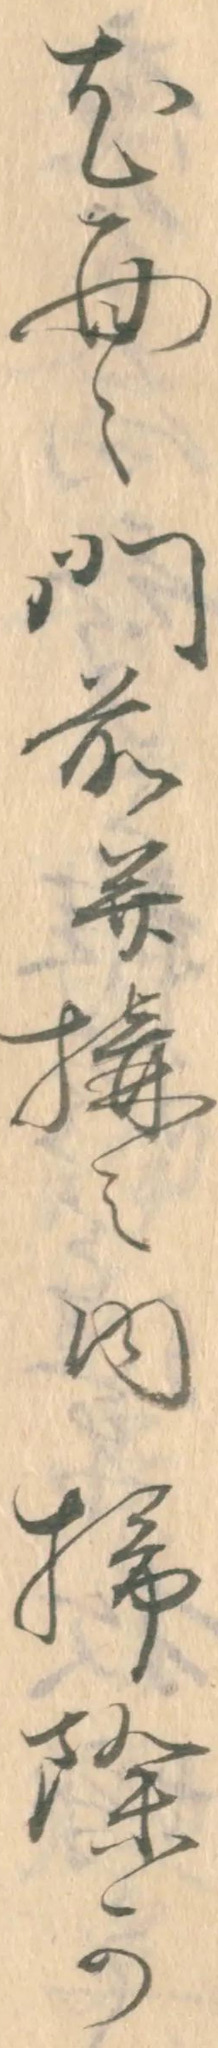尤西之門前并構之内掃除可
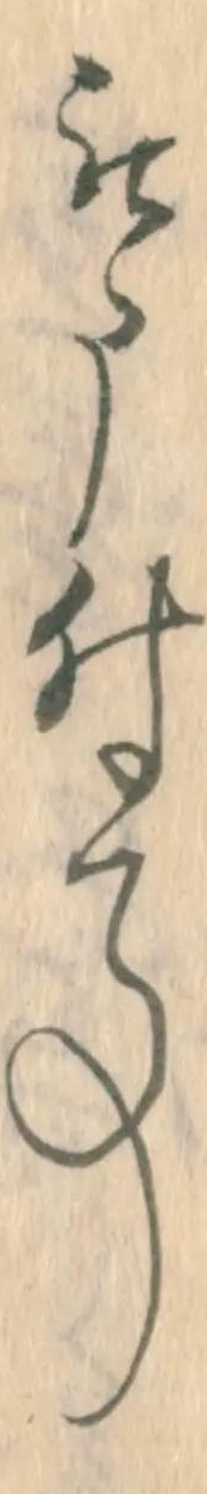被申付事
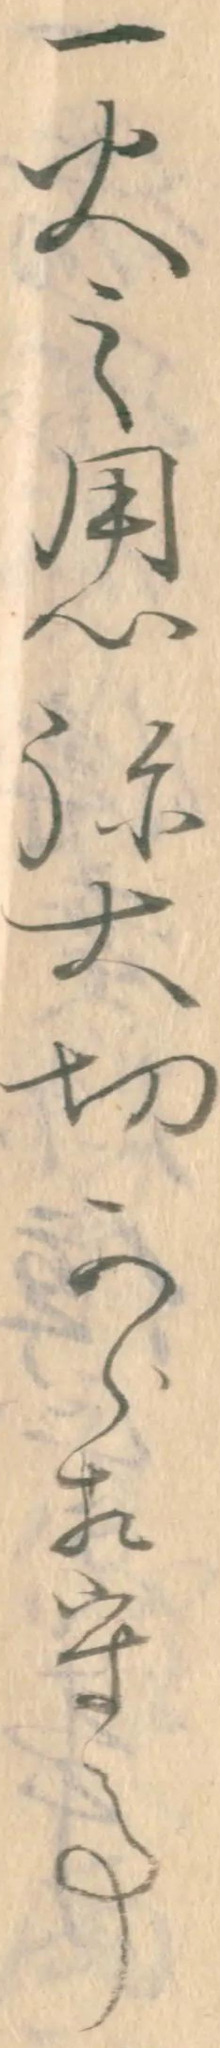一火之用心弥大切可被相守事
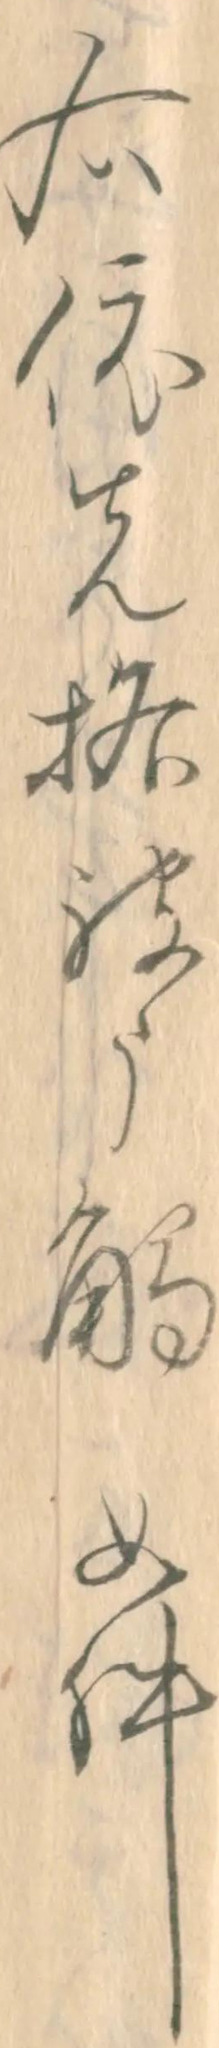右依先格被申触如件
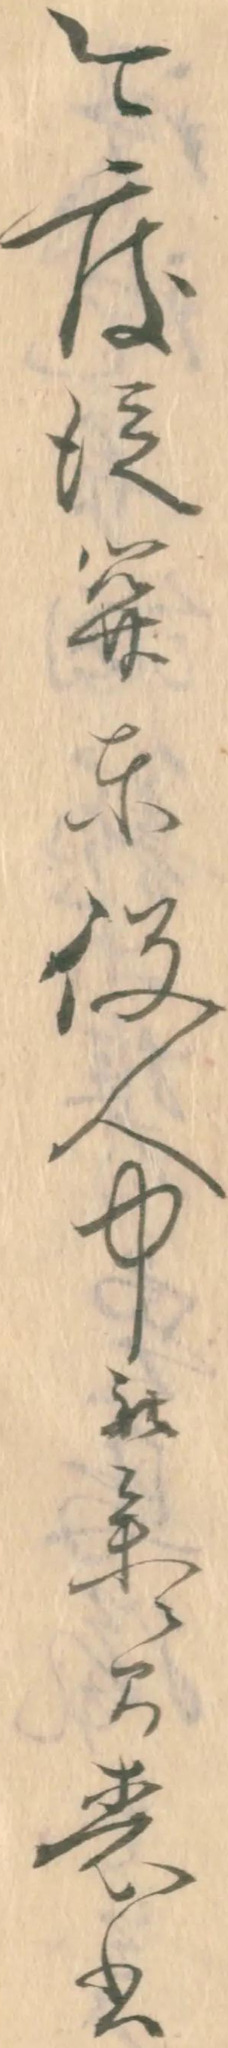今度従関東役人中被参候間表書
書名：賀茂社記録. 第22冊
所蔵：国立国会図書館 National Diet Library, JAPAN
